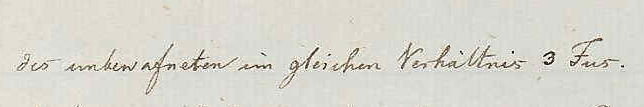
des unbewafneten im gleichen Verhältnis 3 Fus.
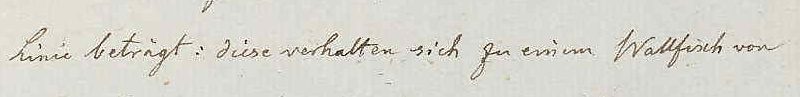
Linie beträgt: diese verhalten sich zu einem Wallfisch von
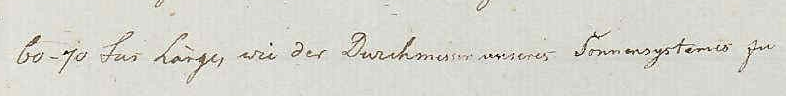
60–70 Fus Länge, wie der Durchmesser unseres Sonnensystemes zu
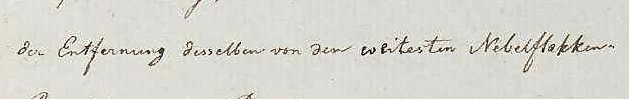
der Entfernung desselben von den weitesten Nebelflekken.
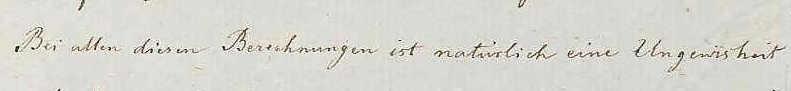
Bei allen diesen Berechnungen ist natürlich eine Ungewisheit
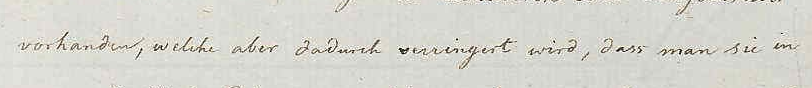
vorhanden, welche aber dadurch verringert wird, dass man sie in
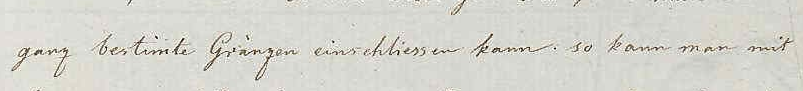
ganz bestimte Gränzen einschliessen kann, so kann man mit
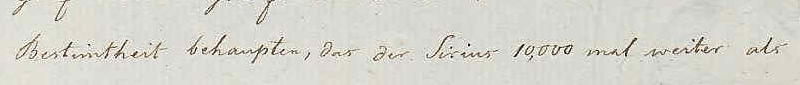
Bestimtheit behaupten, das der Sirius 10,000 mal weiter als
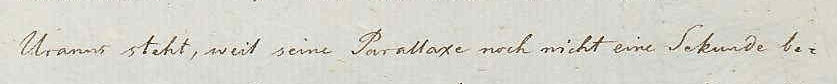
Uranus steht, weil seine Parallaxe noch nicht eine Sekunde be-
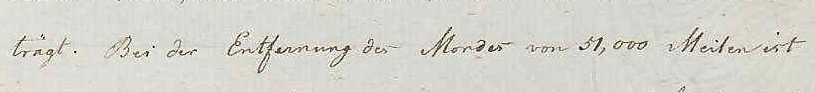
trägt. Bei der Entfernung des Mondes von 51,000 Meilen ist
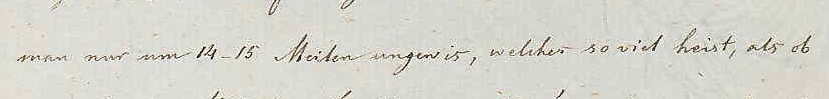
man nur um 14–15 Meilen ungewis, welches so viel heist, als ob
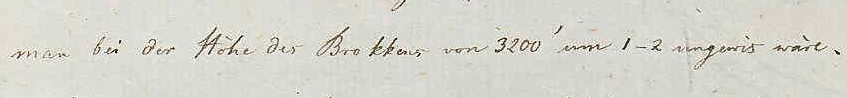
man bei der Höhe des Brokkens von 3200′ um 1–2 ungewis wäre.
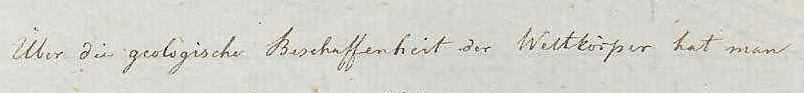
Über die geologische Beschaffenheit der Weltkörper hat man
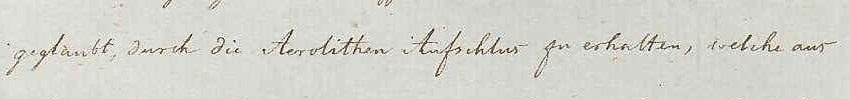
geglaubt, durch die Aerolithen Aufschlus zu erhalten, welche aus
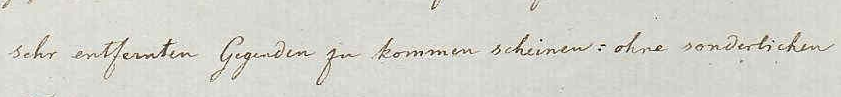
sehr entfernten Gegenden zu kommen scheinen: ohne sonderlichen
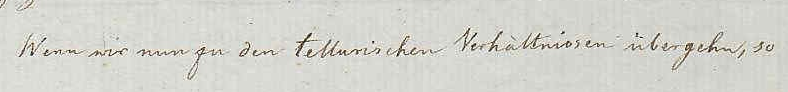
Wenn wir nun zu den tellurischen Verhältnissen übergehn, so
